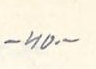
40
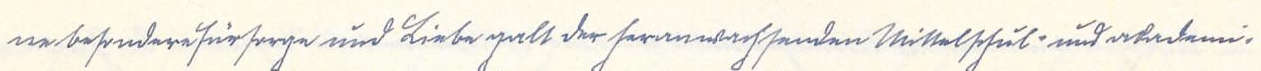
ne besondere Fürsorge und Liebe galt der heranwachsendem Mittelschul- und akademi-
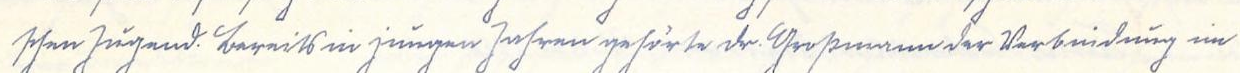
sche Jugend. Bereits in jungen Jahren gehörte Dr. Großmann der Verbindung im
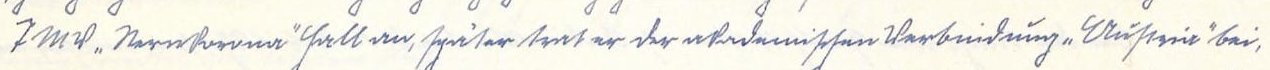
TMV „Sternkorona“ Hall an, später trat er akademischen Verbindung „Austria“ bei,
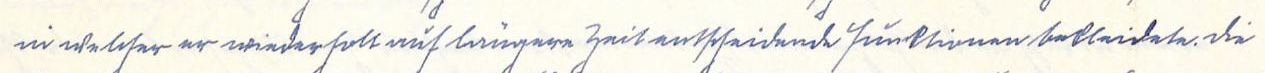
in welcher er wiederholt auf längere Zeit entscheidende Funktionen bekleidete. Die
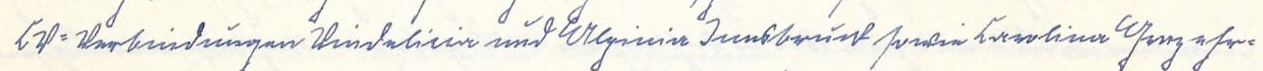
CV-Verbindungen Vindelicia und Alpinia Innsbruck sowie Carolina Graz ehr-
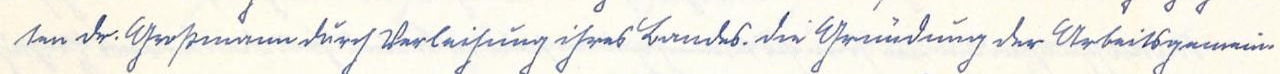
te Dr. Großmann durch Verleihung ihres Bandes. Die Gründung der Arbeitsgemein-
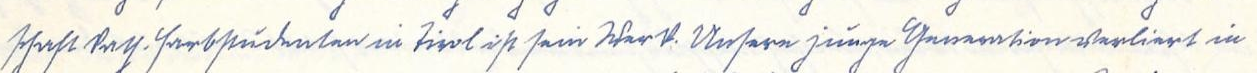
schaft katholischer Farbstudenten in Tirol ist sein Werk. Unsere junge Generation verliert in
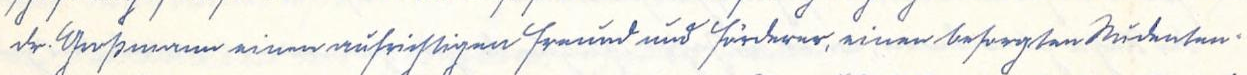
Dr. Großmann einen aufrichtigen Freund und Förderer, einen besorgten Studenten-
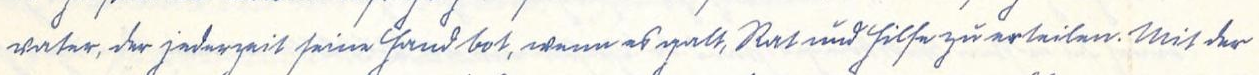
vater, der jederzeit seine Hand bot, wenn es galt Rat und Hilfe zu erteilen. Mit der
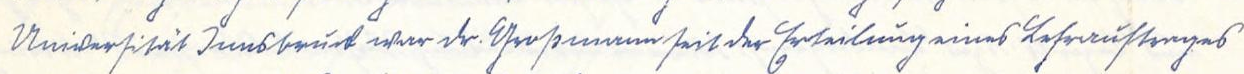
Universität Innsbruck war Dr. Großmann seit der Erteilung eines Lehrauftrages
